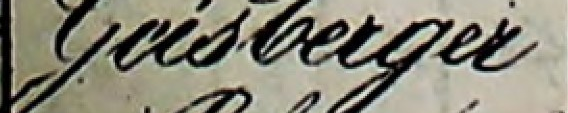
Geisberger
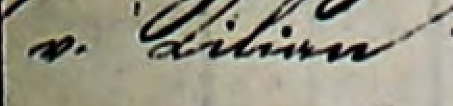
v. Kilian
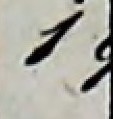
1
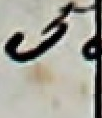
5
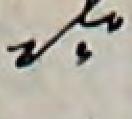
Do
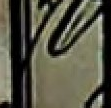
76
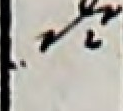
Do
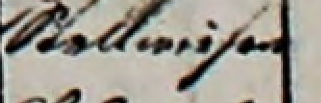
Stellwiesen
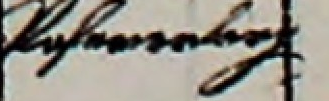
Po???berg
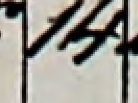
14
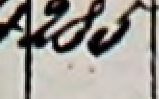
285
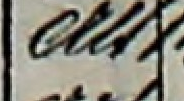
Alt
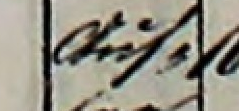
Aus„
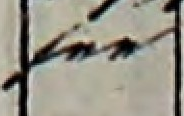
see
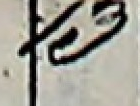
13
